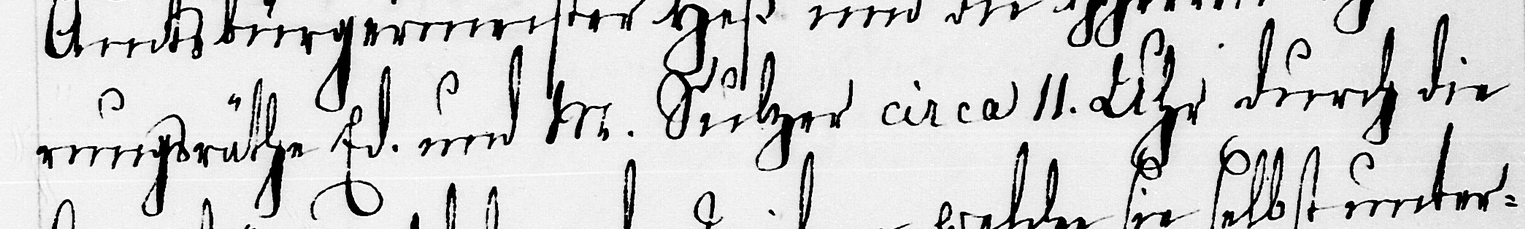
rungsräthe Ed. und M. Sulzer circa 11. Uhr durch die
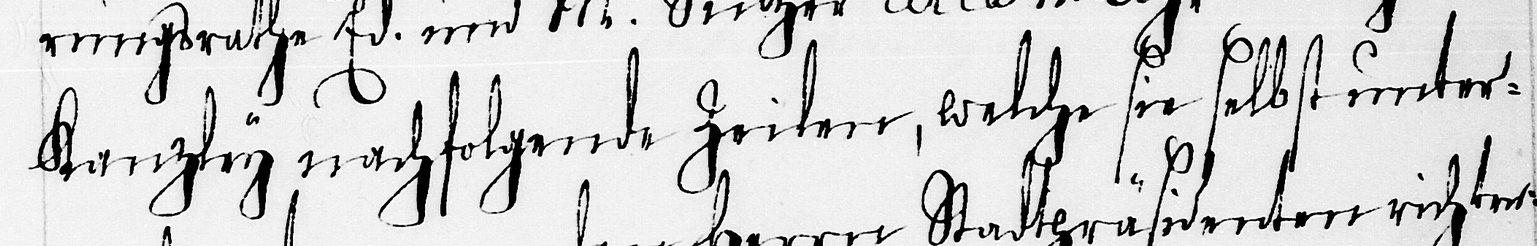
Kanzley nachfolgende Zeilen, welche sie selbst unter¬
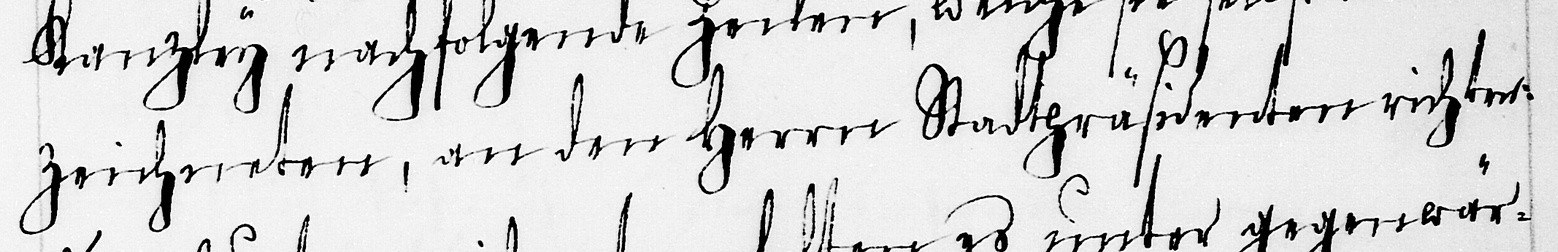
zeichneten, an den Herrn Stadtpräsidenten richten:
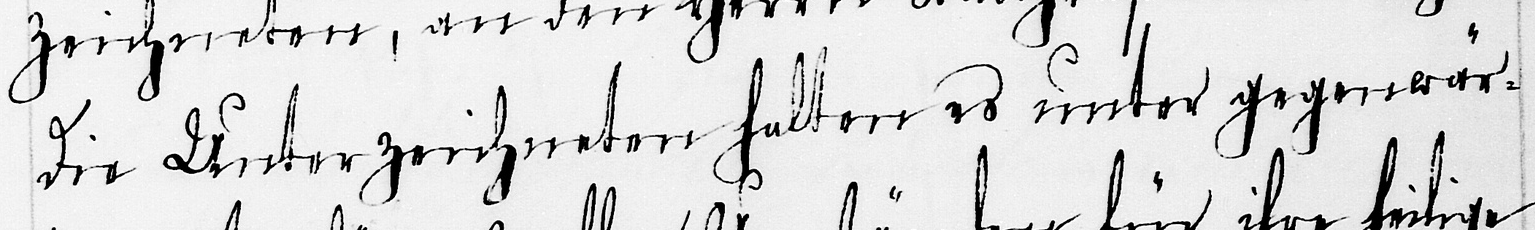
Die Unterzeichneten halten es unter gegenwär¬
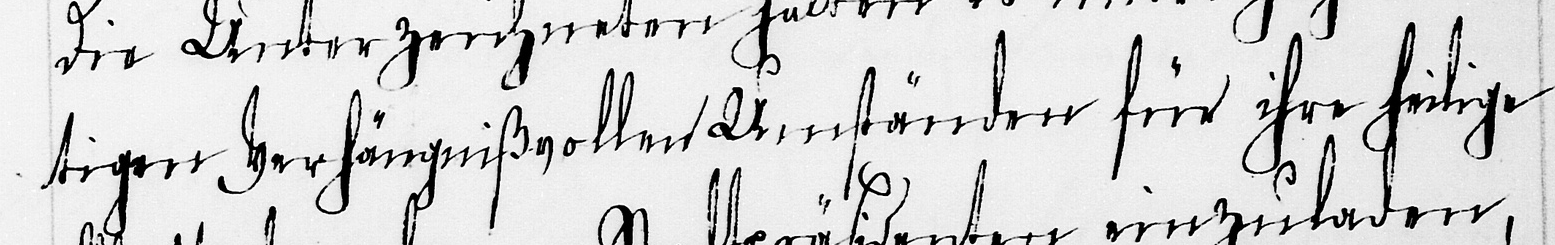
tigen Verhängnißvollen Umständen für ihre heilige
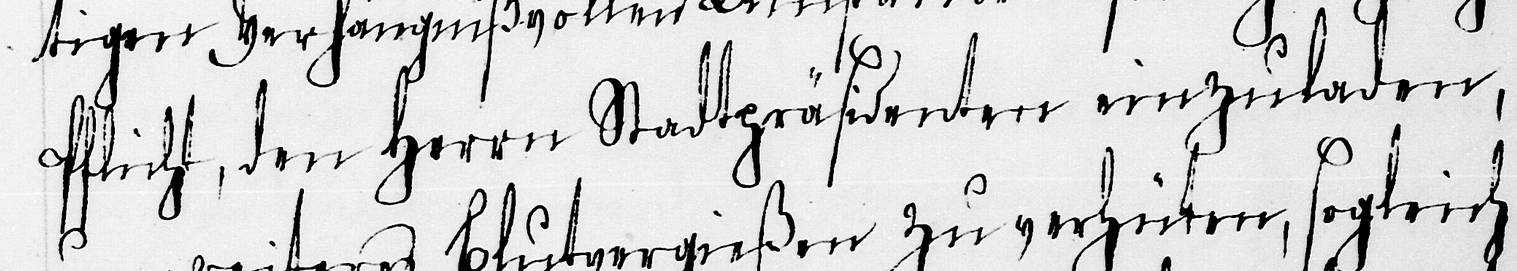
Pflicht, den Herrn Stadtpräsidenten einzuladen,
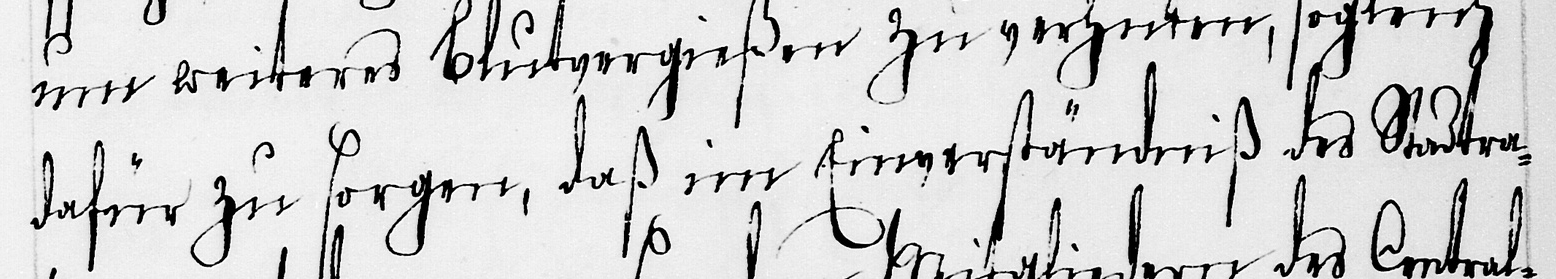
dafür zu sorgen, daß im Einverständniß des Stadtra¬
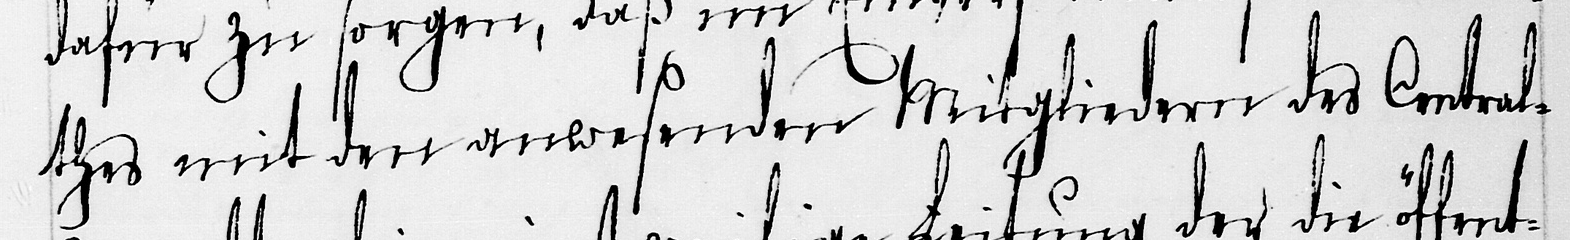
thes mit den anwesenden Mitgliedern des Centra¬
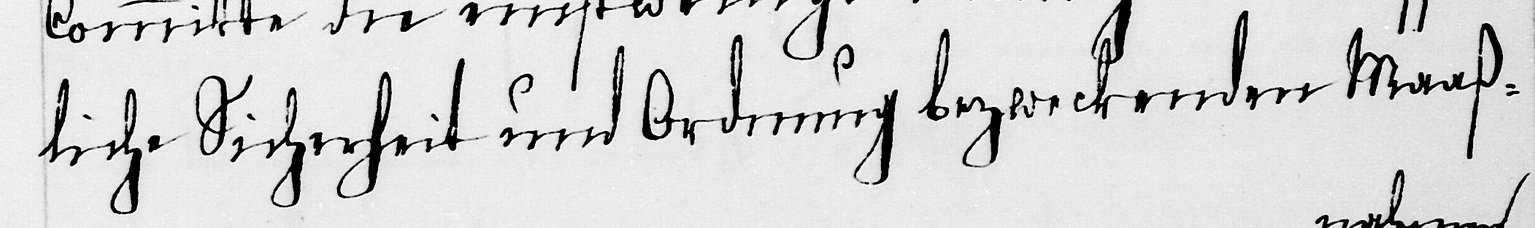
liche Sicherheit und Ordnung bezweckenden Maaß-
